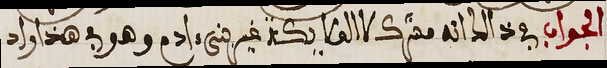الجواب في ذالك انه مشرك لا الملايكة غير شيء ءادم وهو في هذا راد
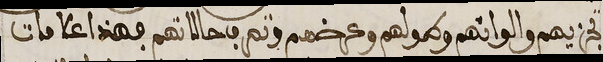تجزيهم و الوا نهم و طولهم وعرضهم وتصرف حالاتهم فهذا اعلامات
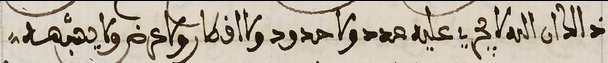ذالك ان الله لا يجري عليه عدد ولا حدود و لا اقطار و لا عرض و لا يشبهه
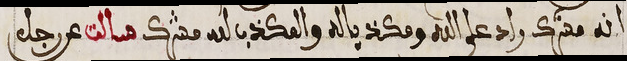انه مشرك راد على الله و مكذبا له و المكذب لله مشرك سالت عن رجل
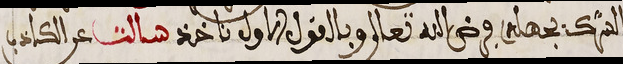الشرك بجهله فرض الله تعال و بالقول الاول ناخذ سالت عن الكاذب
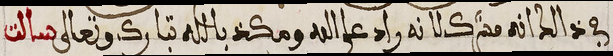في ذالك انه مشرك لانه راد على الله و مكذبا لله تبارك و تعالى سالت
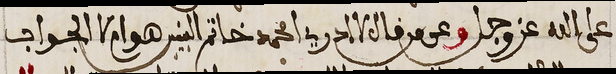على الله عز و جل وعن من قال لا ادري امحمد خاتم النبيين هو ام لا الجواب
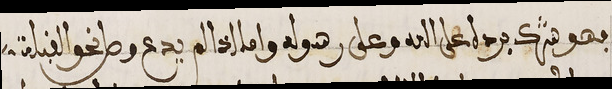فهو شرك برده و على رسوله و اما اذا لم يدع و صل نحو القبلة
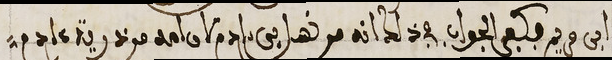ابي مريم فكفر الجواب في ذلك انه من نسل بنى ءادم لان امه من ذرية ءادم
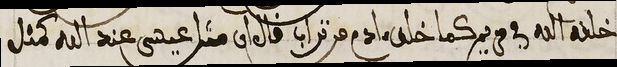خلقه الله من مريم كما خلق ءادم من تراب قال ان مثل عيسى عند الله كمثل
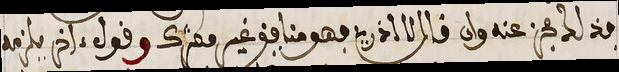فذلك مجن عنه و ان قال لا ادري فهو منافق غير مشرك و قول ءاخر يلزمه
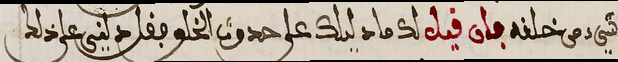شيء من خلقه فان قيل لك ما دليلك على حدوث الخلق فقل دلينى على ذلك
